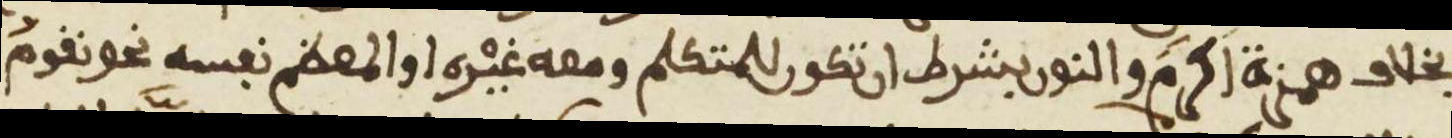بخلاف همزة اكرم و النون بشرط ان تكون للمتكلم و معه غيره او المعظم نفسه نحو نقوم
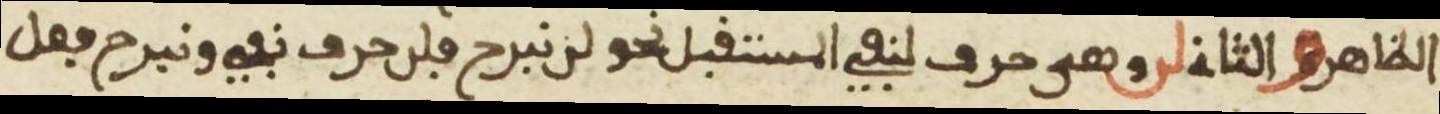الظاهر و الثاني لن و هي حرف لنفي المستقبل نحو لن نبرح فلن حرف نفي و نبرح فعل
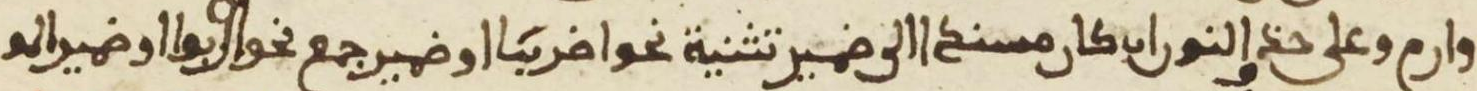و ارم و على حذف النون ان كان مسندا الى ضمير تثنية نحو اضربا او ضمير جمع نحو ### او ضمير المو
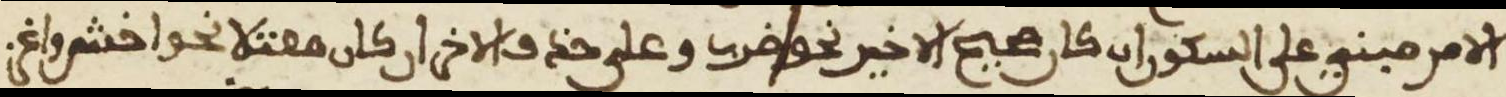االامر مبني على السكون ان كان صحيح الاخير نحو ضرب و على حذف الاخر ان كان معتلا نحو اخشى واغز
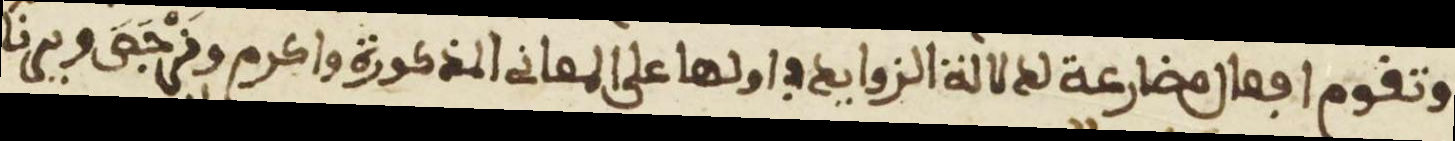و تقوم افعال مضارعة لدلالة الزوايد في اولها على المعانى المذكورة و اكرم و نرجص و يرنا
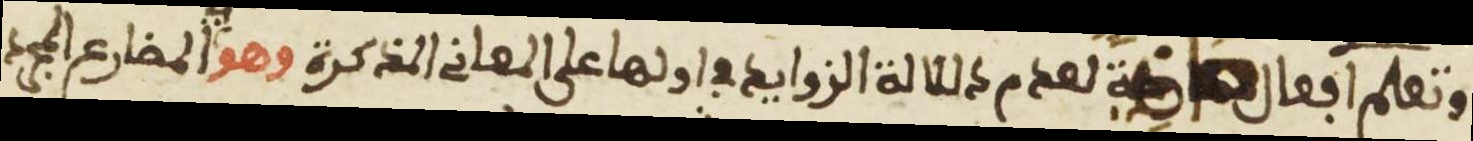و تعلم افعال لعدم دلالة الزوايد في اولها على المعانى المذكرة و هو المضارع المجرد
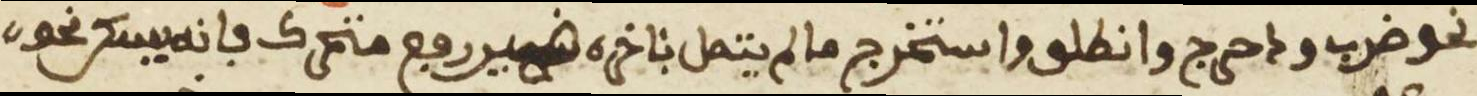نحو ضرب و دحرج و انطلق و استخرج ما لم يتصل بآخره ضمير رفع متحرك فانه يسكن نحو
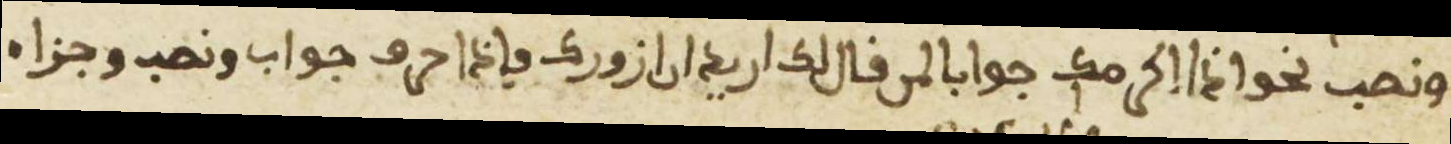و نصب نحو اذا اكرمك جوابا لمن قال لك اريد ان ازورك فاذا حرف جواب و نصب و جزاء
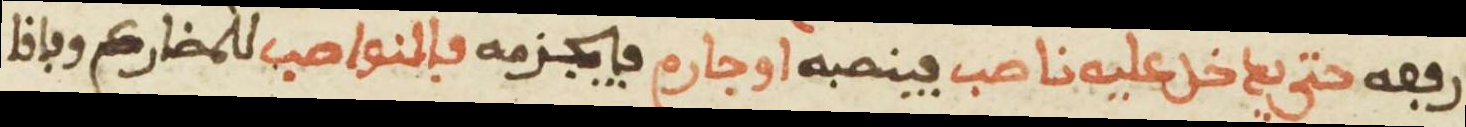رفعه حتى يدخل عليه ناصب فينصبه او جازم فيجزمه فالنواصب للمضارع وفاقا ###
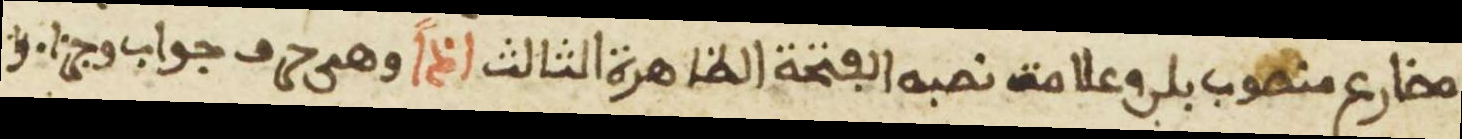مضارع منصوب بلن و علامة نصبه الفتحة الظاهرة الثالث اذا و هي حرف جواب و جزاء
